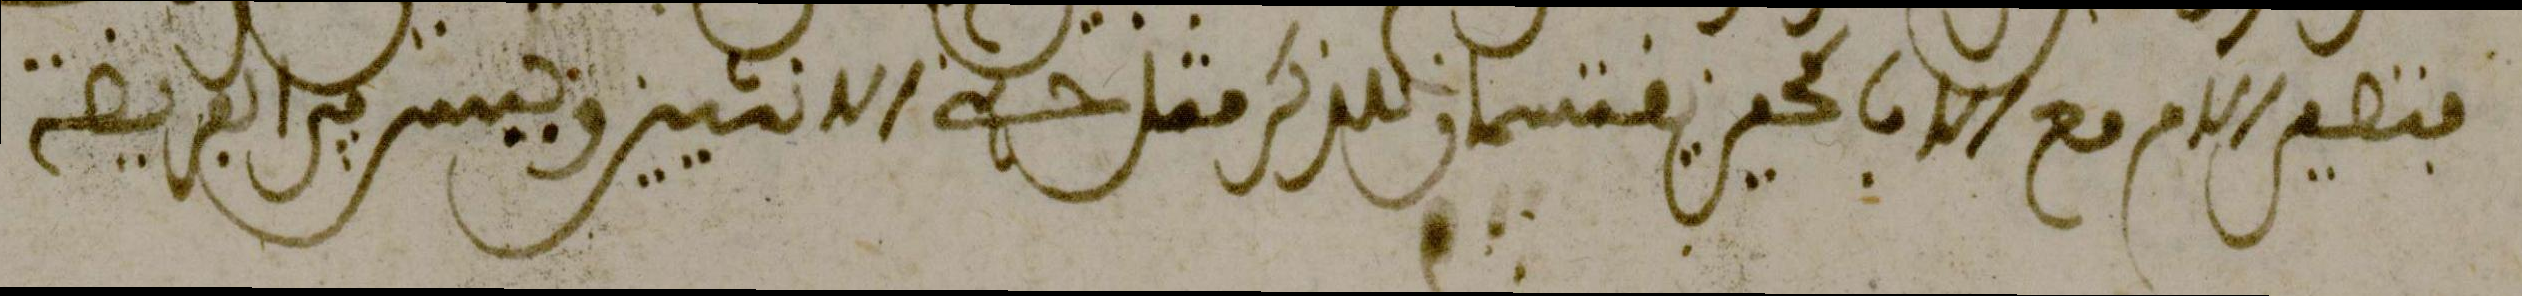فتصير الام مع الاب كحيز يقتسمان للذكر مثل حظ الانثيين وليس في الفريضة
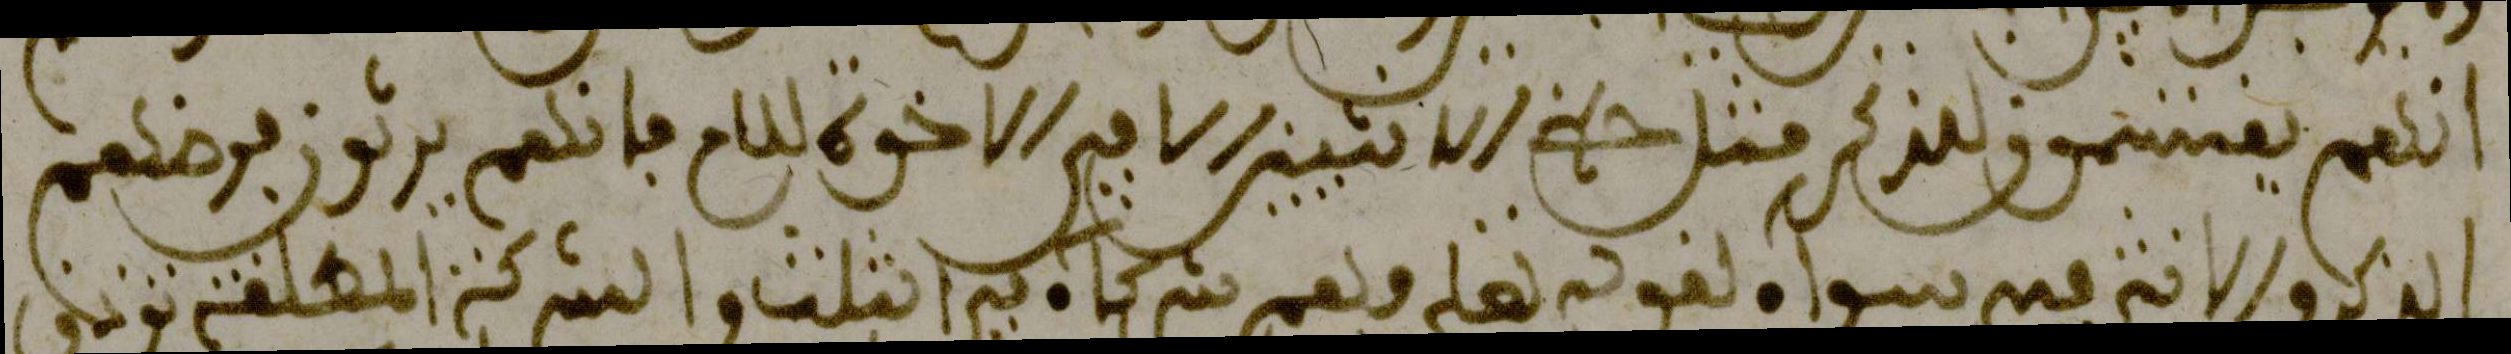انهم يقتسمون للذكر مثل حظ الانثيين الا في الاخوة للام فانهم يرثون فرضهم
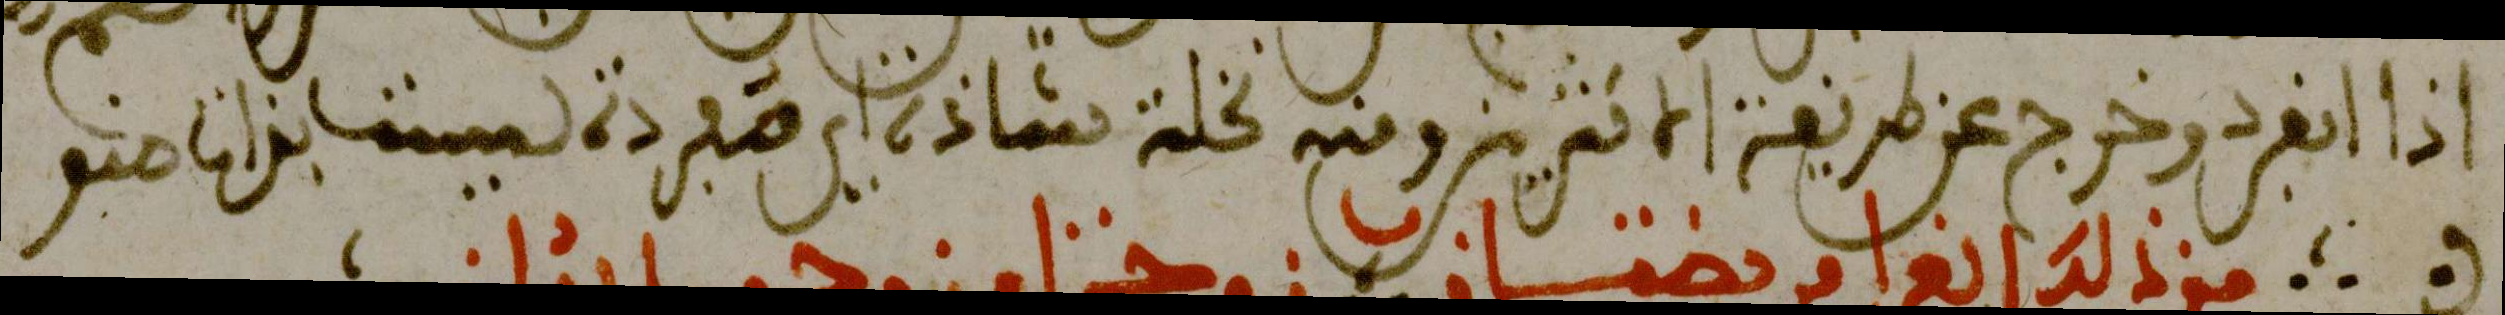اذا انفرد وخرج عن طريقة الا كثرين ومنه نخلة شاذة اي مفردة ليست بذات صنو
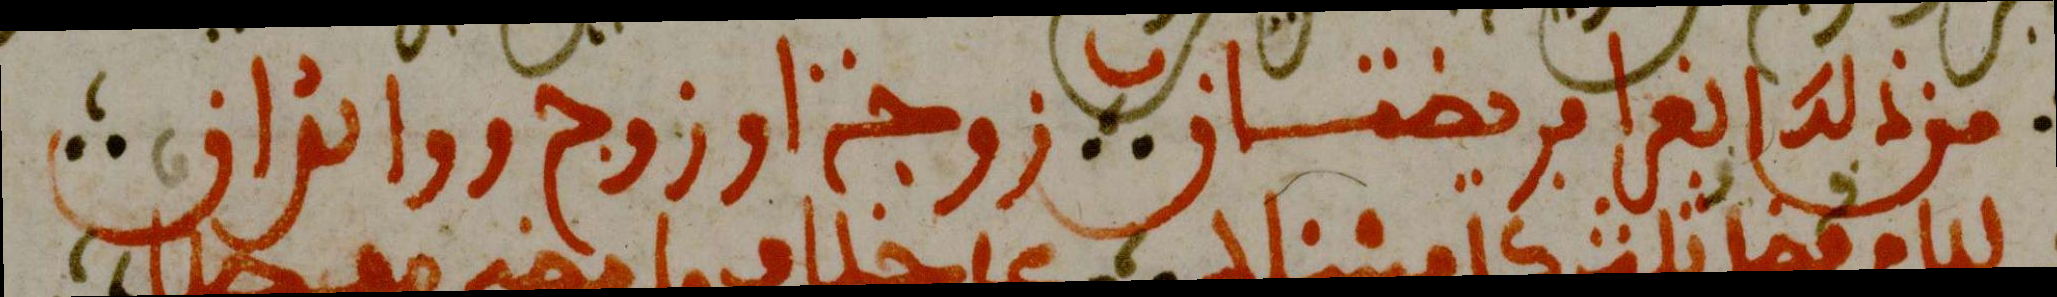من ذلك الغرا فريضتان زوجة او زوج وولدان
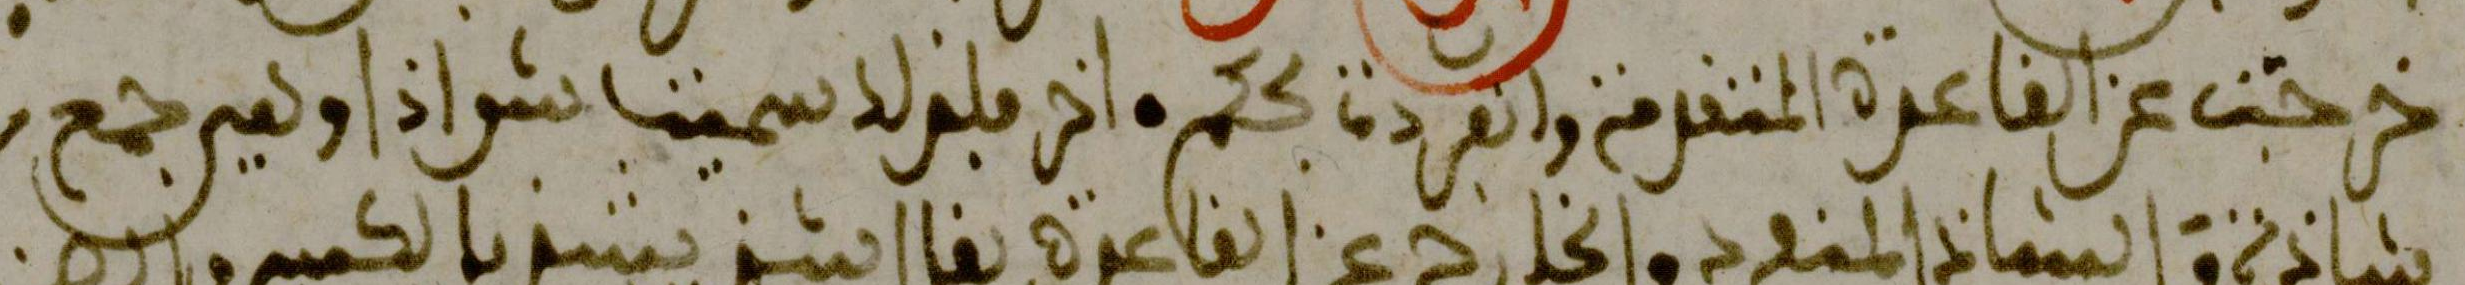خرجت عن القاعدة المتقدمة وانفردت بحكم ءاخر فلذلك سميت شواذ او هي جمع
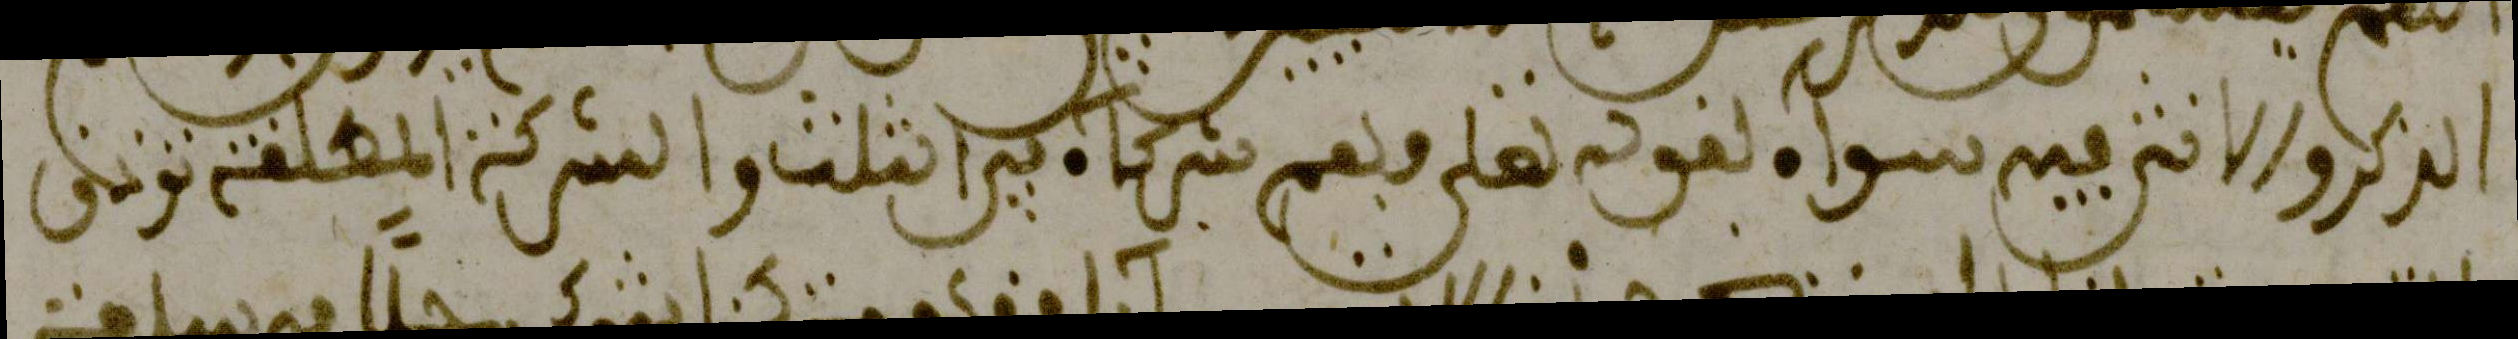الذكر والانثى فيه سواء لقوله تعلى فهم شركاء في الثلث والشركة المطلقة توذن
